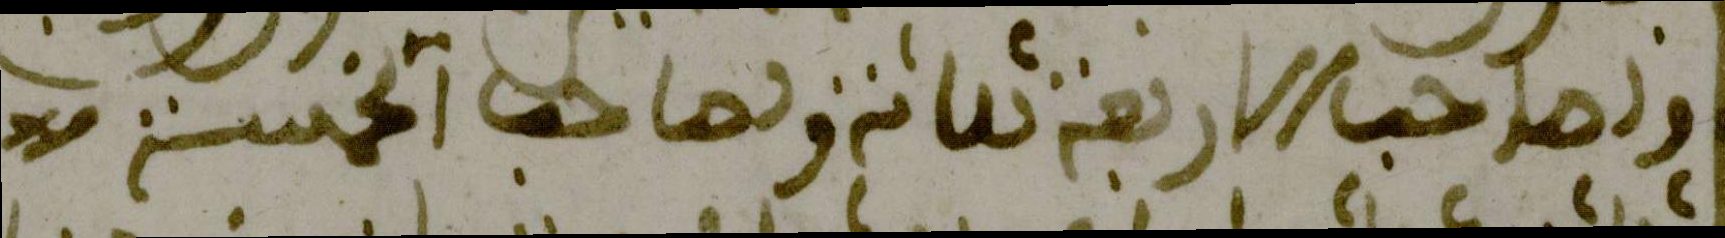لصاحب الاربعة ثلاثة ولصاحب الخمسة
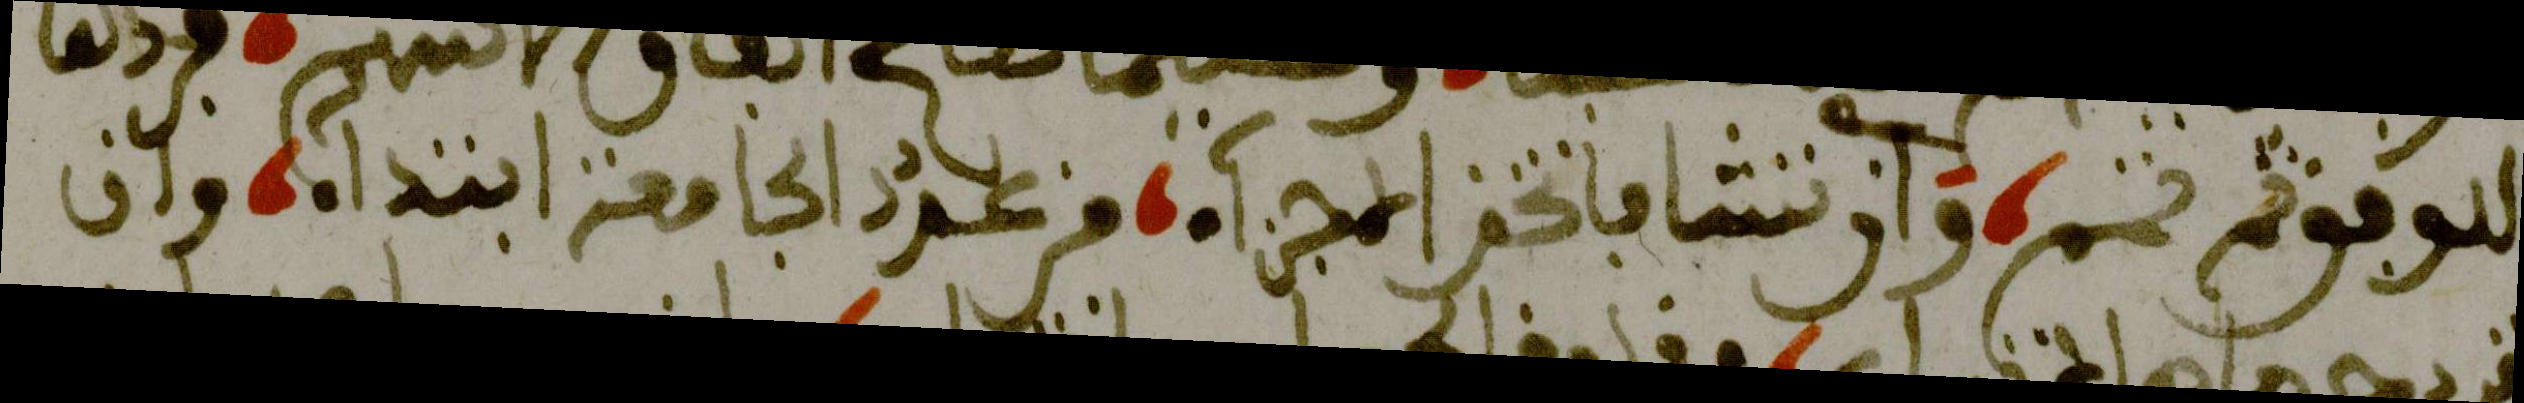للوفق ثم تمم وَان تشا فاتخذ الاجزاء من عدد الجامعة ابتداء وان
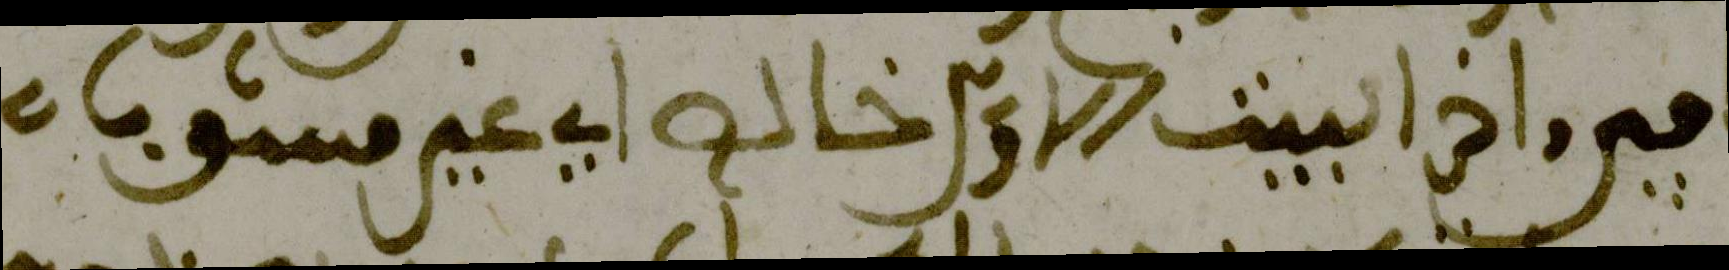في اخر البيت الاوَّل خالص اي غير مشوب
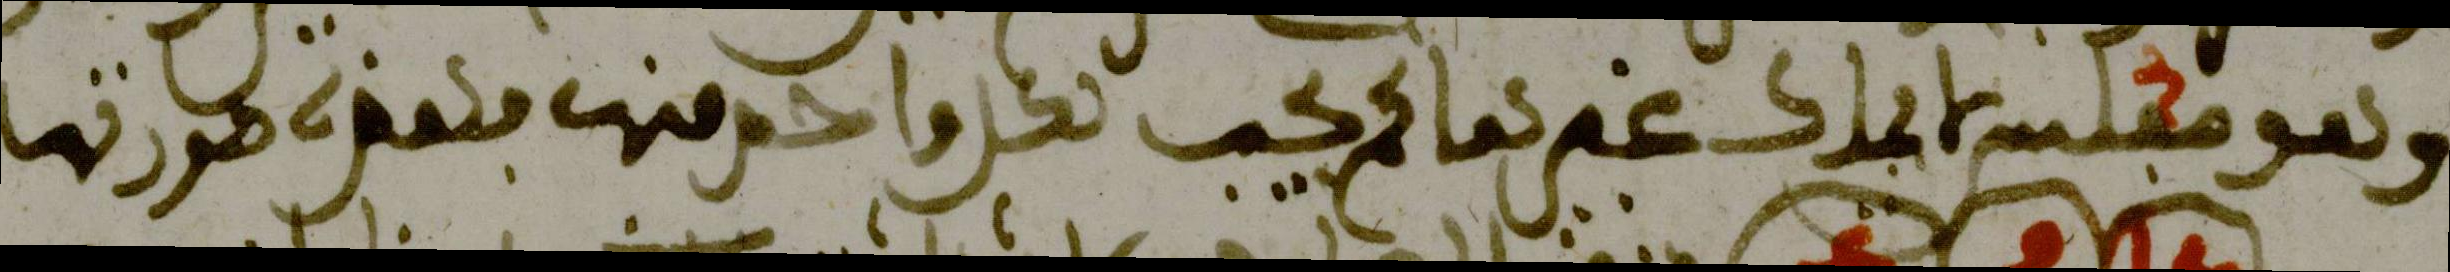وهو مفلس لا يملك غيرها كم يجب لكل واحد منها فهذه صورتها
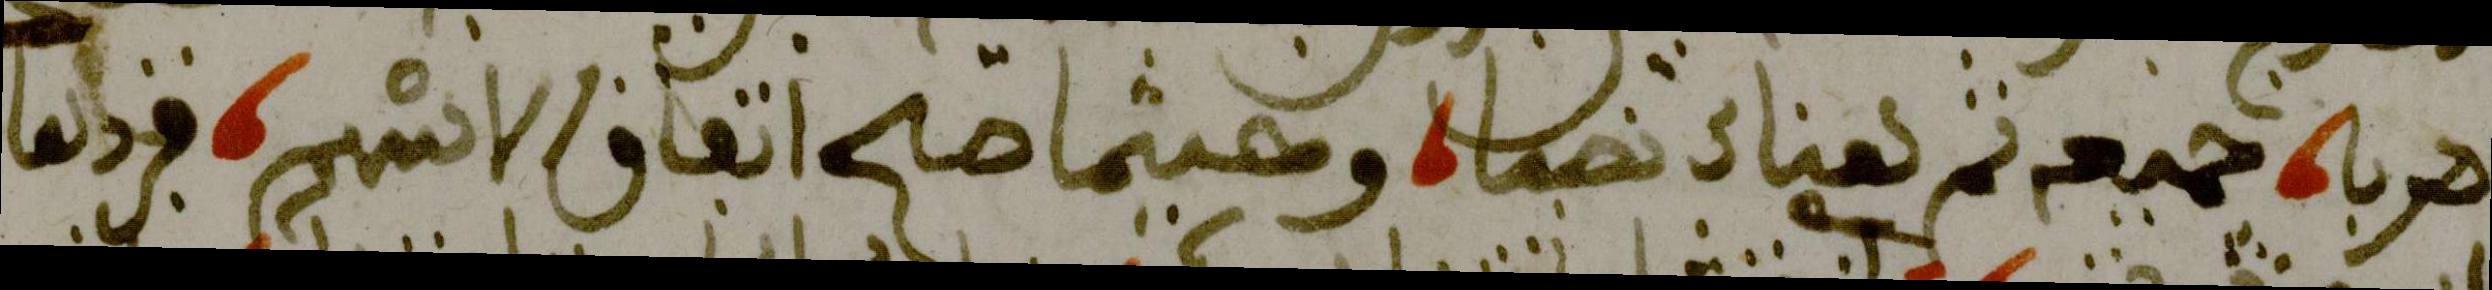ضربا جميعه ثم هناك نصبا وحيثما صح اتفاق الاسهم فردها
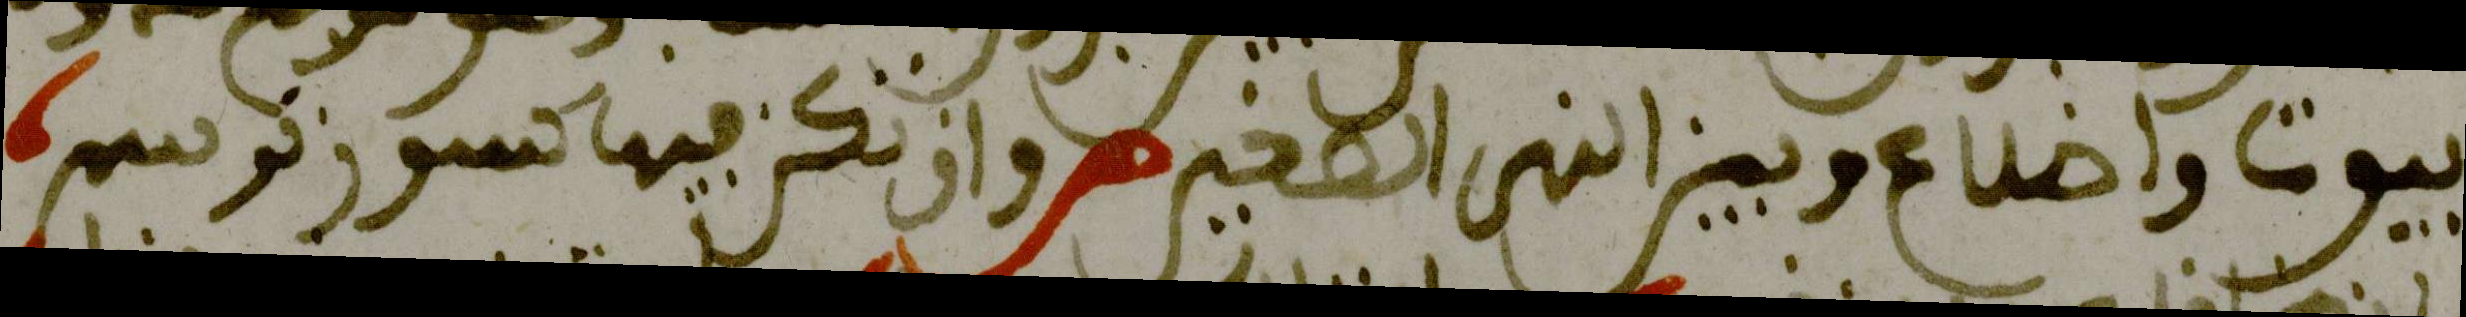بيوت واضلاع وبين النهر الصغير ص وان تكن فيها كسور ترسم
